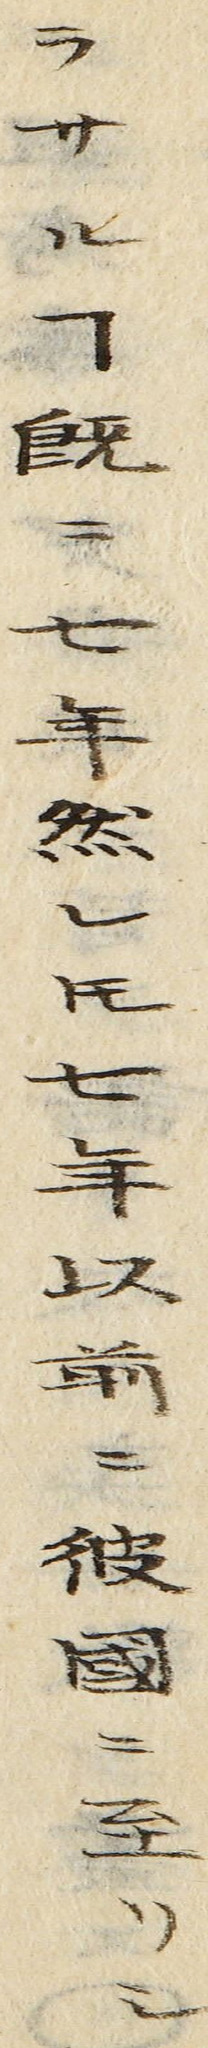ラサルコト既ニ七年然レトモ七年以前ニ彼国ニ至リシ
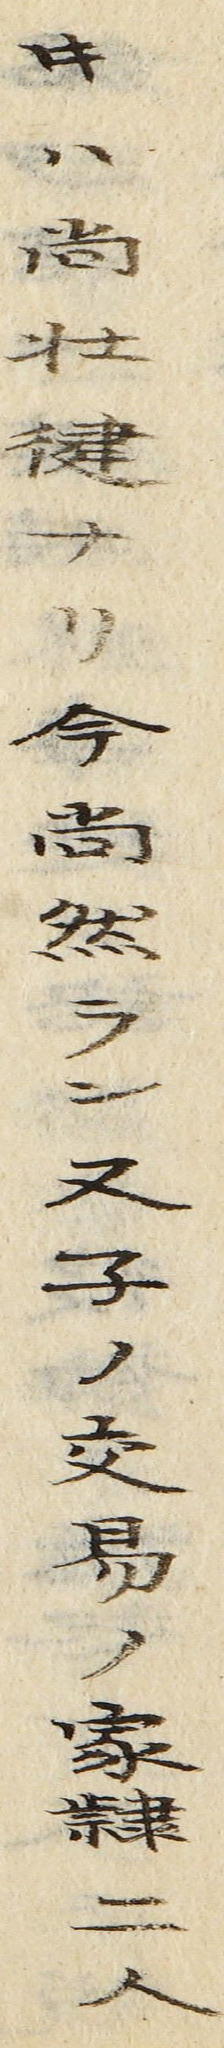トキハ尚壮健ナリ今尚然ラン又子ノ交易ノ家隷二人
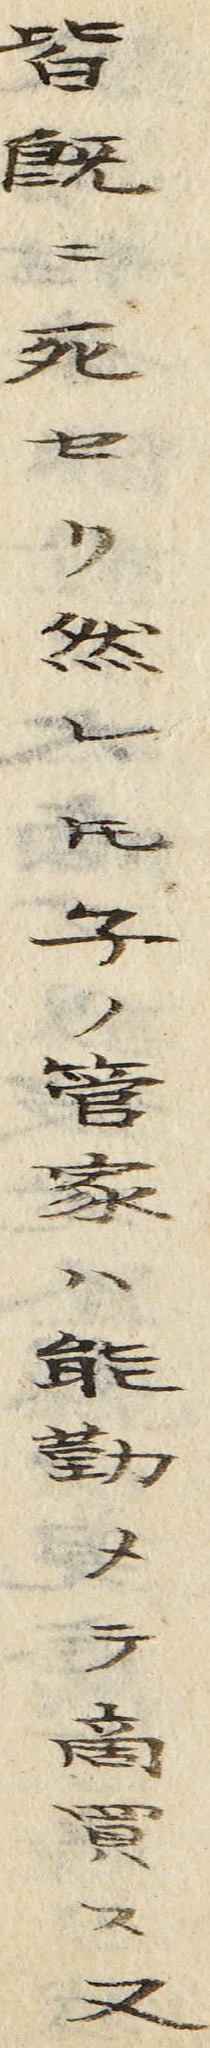皆既ニ死セリ然レトモ子ノ管家ハ能勤メテ商買ス又
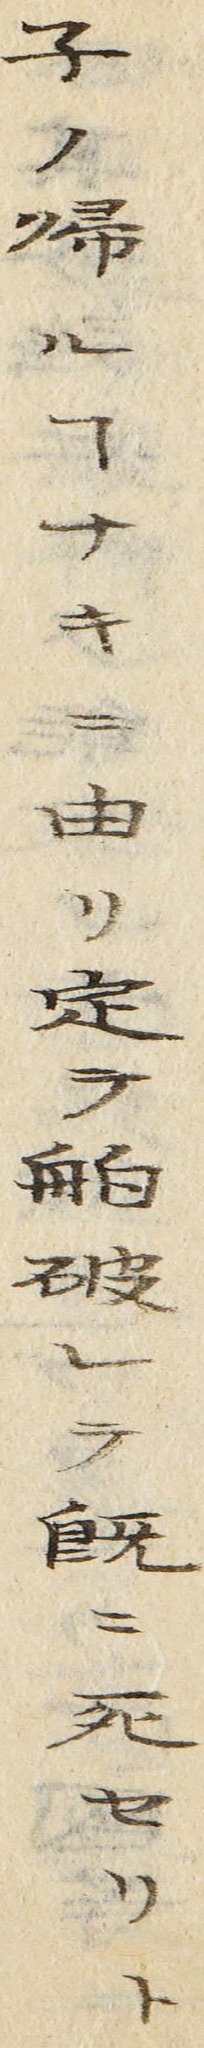子ノ帰ルコトナキニ由リ定テ舶破レテ既ニ死セリト
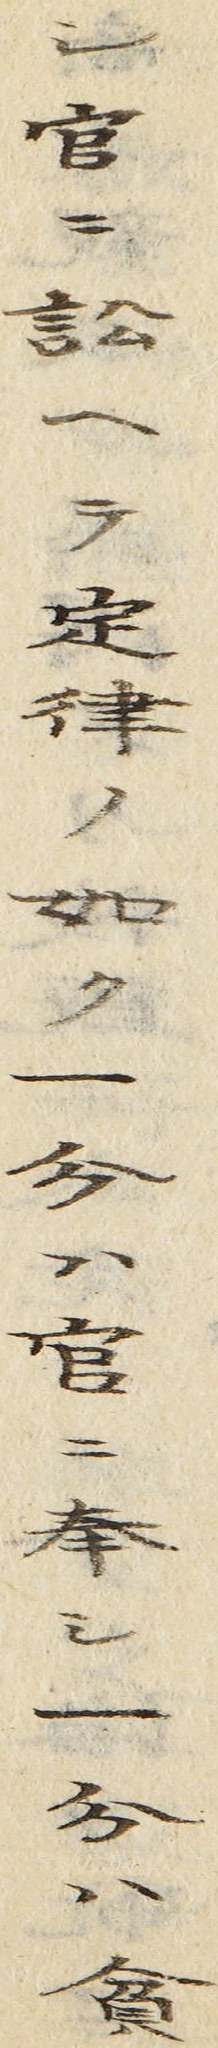シ官ニ訟ヘテ定律ノ如ク一分ハ官ニ奉シ一分ハ貧
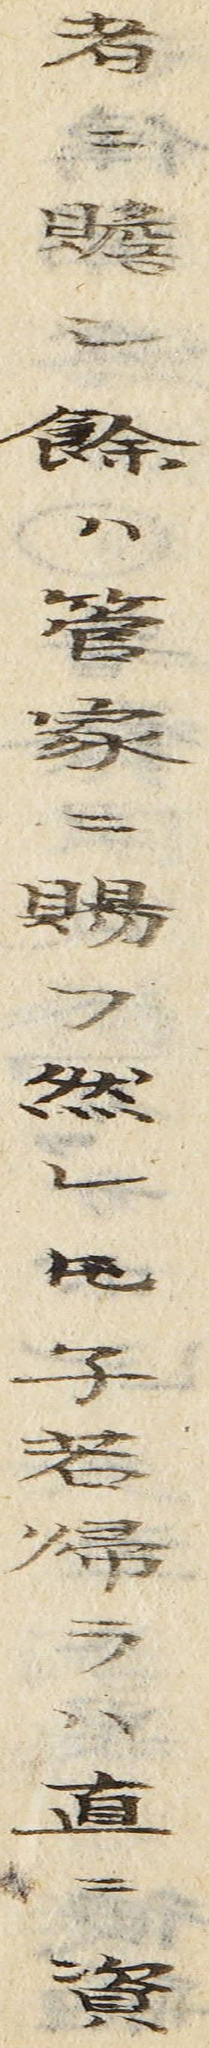者ニ贍シ余ハ管家ニ賜フ然レトモ子若帰ラハ直ニ資
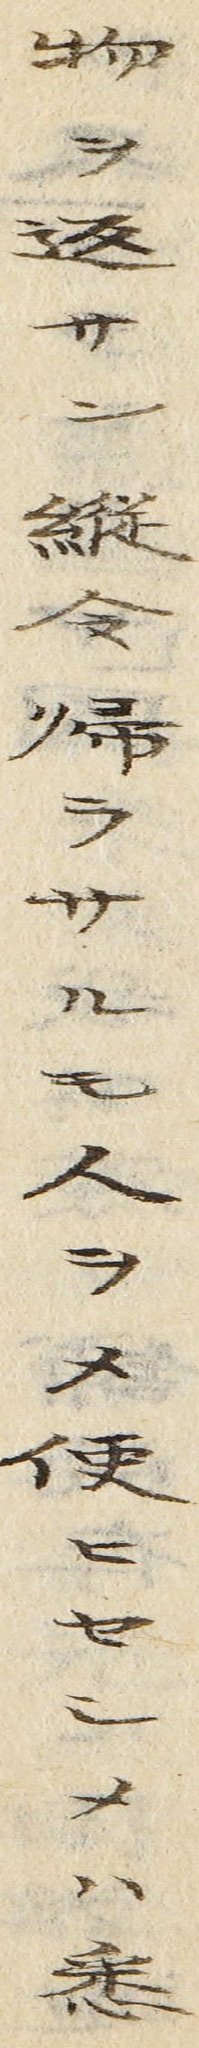物ヲ返サン縦令帰ラサルモ人ヲシテ使ヒセシメハ悉
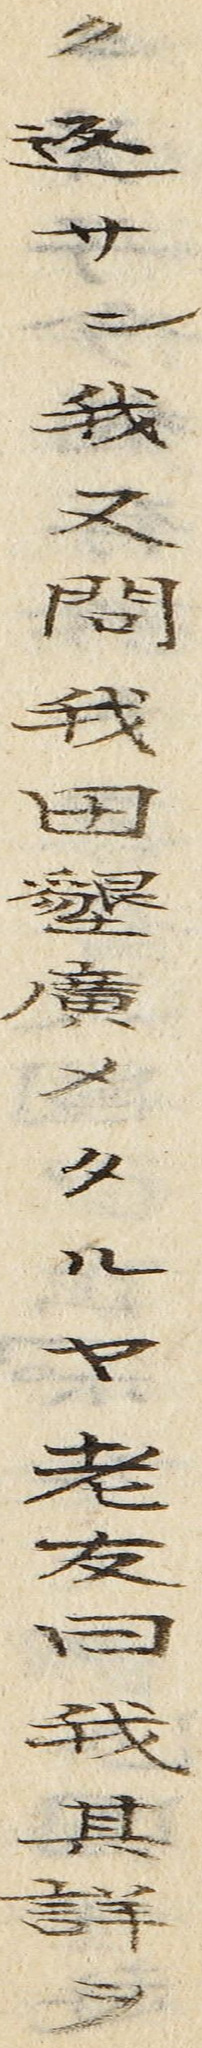ク返サン我又問我田墾広メタルヤ老友曰我其詳ヲ
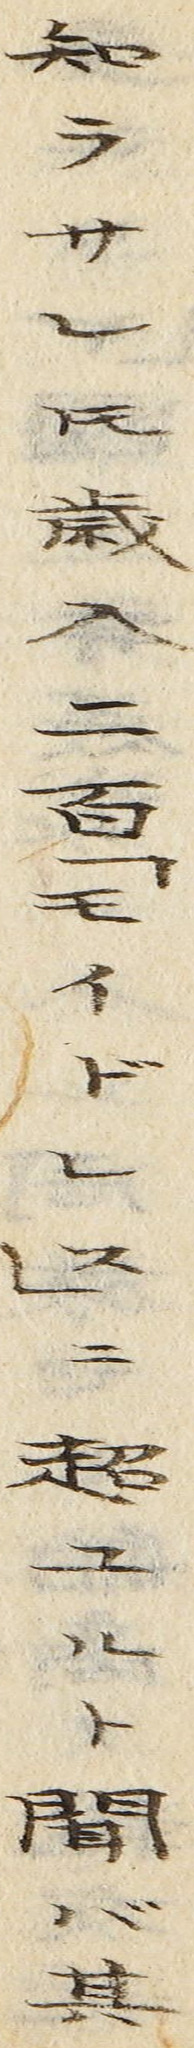知ラサレトモ歳入二百「モイドレス」ニ超ユルト聞バ其
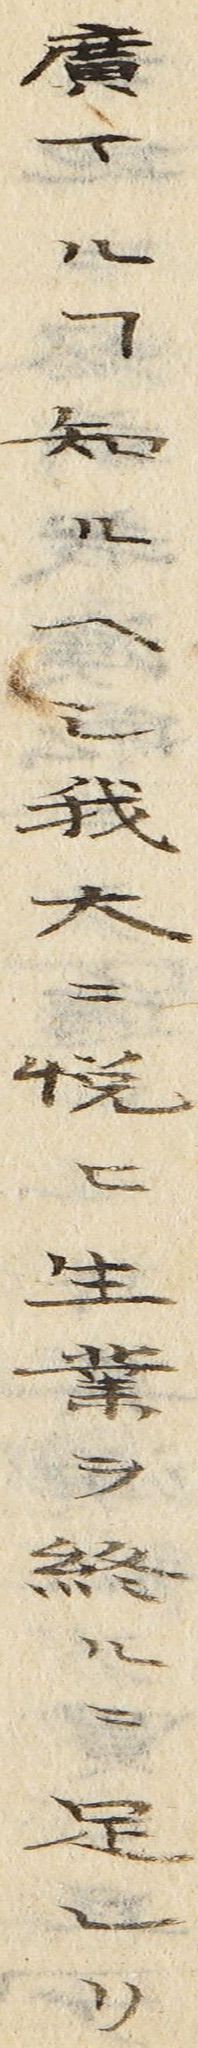広マルコト知ルヘシ我大ニ悦ヒ生業ヲ終ルニ足レリ
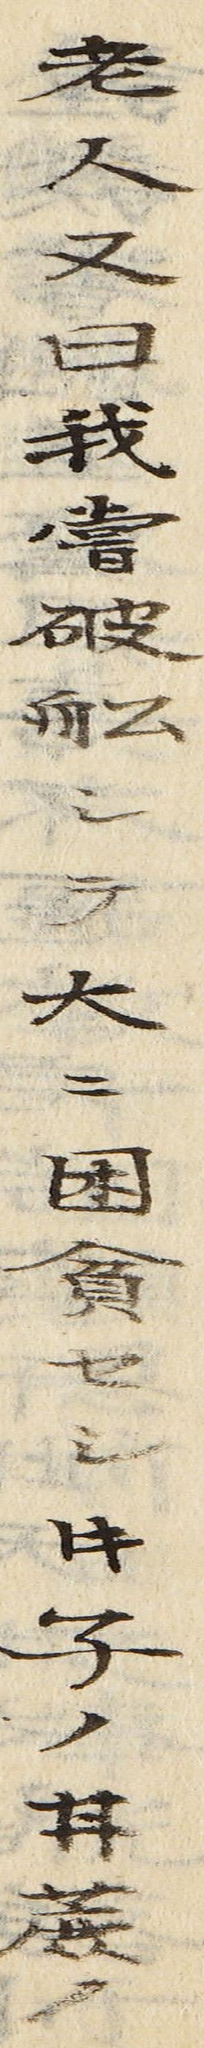老人又曰我嘗破船シテ大ニ困貧セシトキ子ノ甘蔗ノ
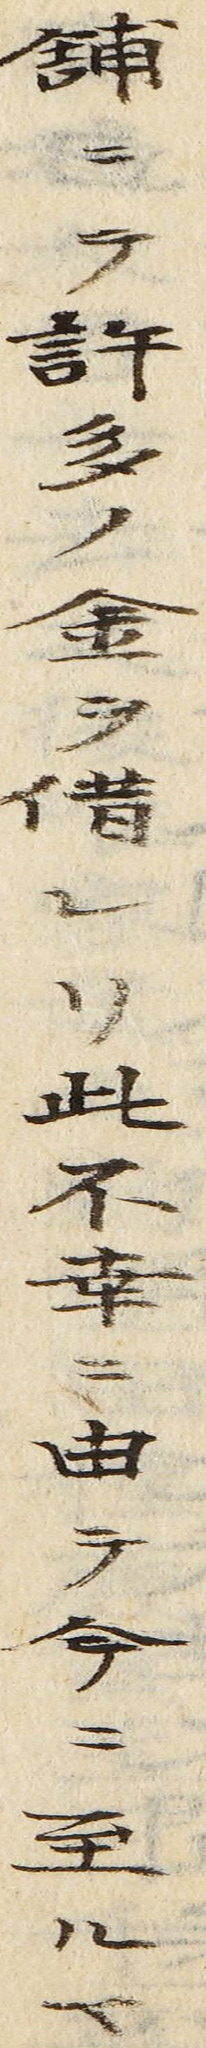舗ニテ許多ノ金ヲ借レリ此不幸ニ由テ今ニ至ルマ
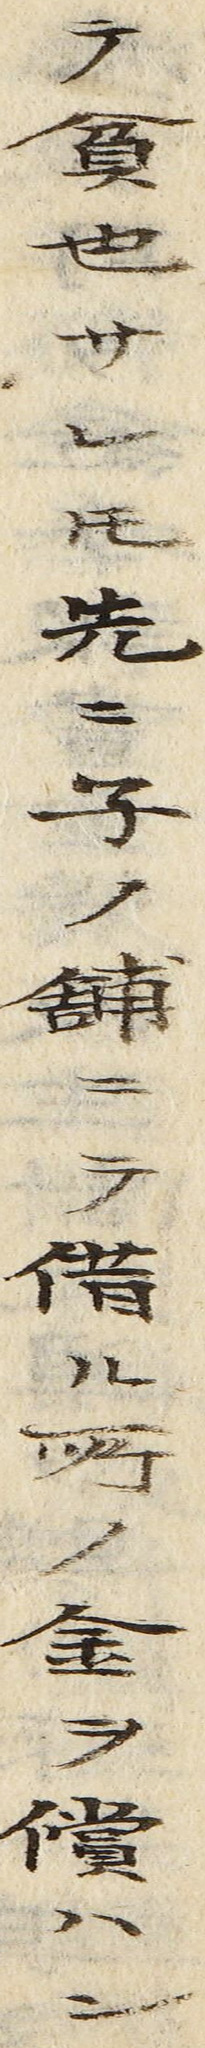テ貧也サレトモ先ニ子ノ舗ニテ借ル所ノ金ヲ償ハン
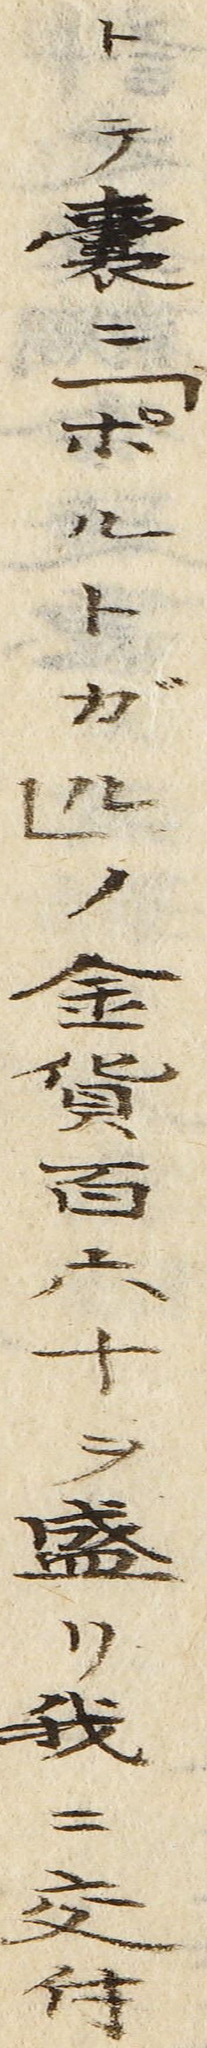トテ嚢ニ「ポルトガル」ノ金貨百六十ヲ盛リ我ニ交付
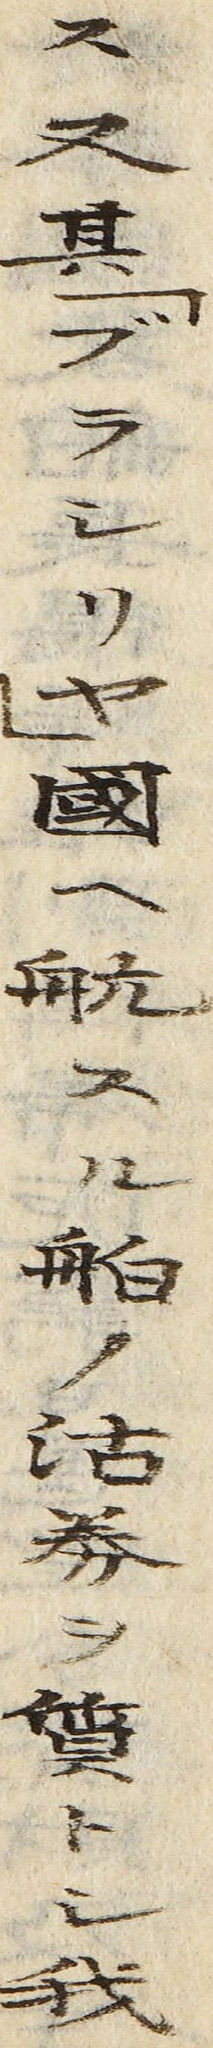ス又其「ブラシリヤ」国ヘ航スル舶ノ沽券ヲ質トシ我
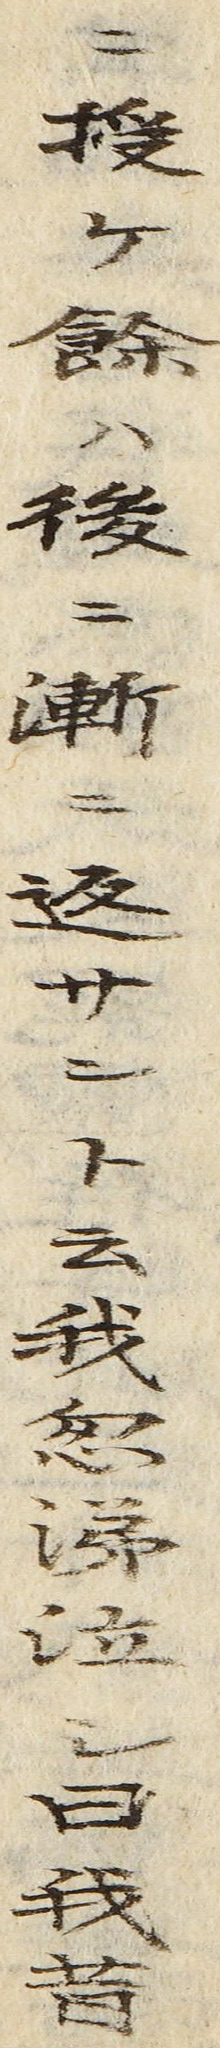ニ授ケ余ハ後ニ漸ニ返サント云我忽涕泣シ曰我昔
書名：漂流紀事
